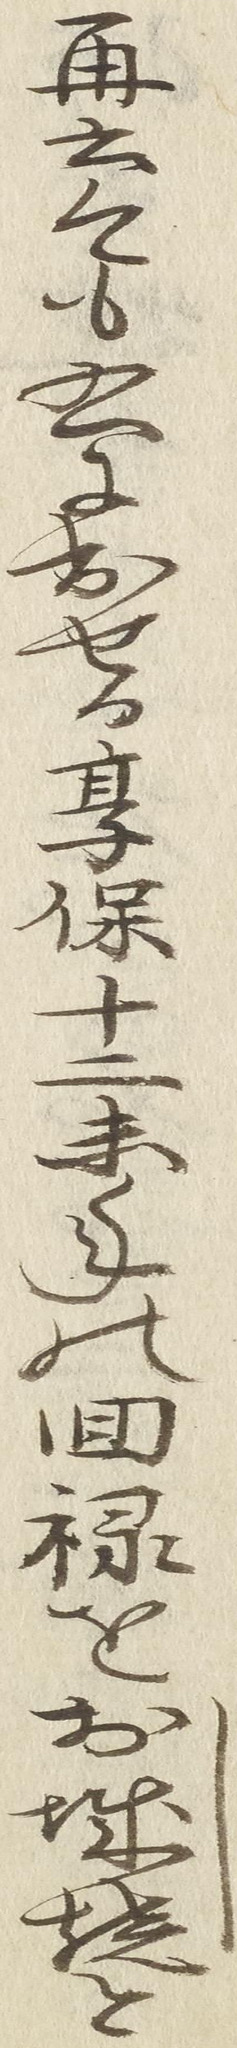再云今も右に出せる享保十二未年の回禄をお城焼と
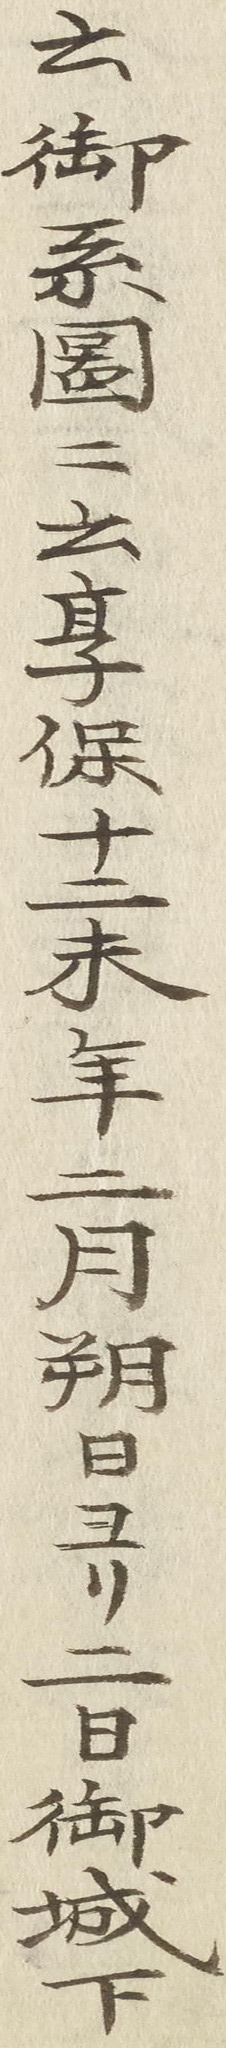云御系図二云享保十二未年二月朔日ヨリ二日御城下
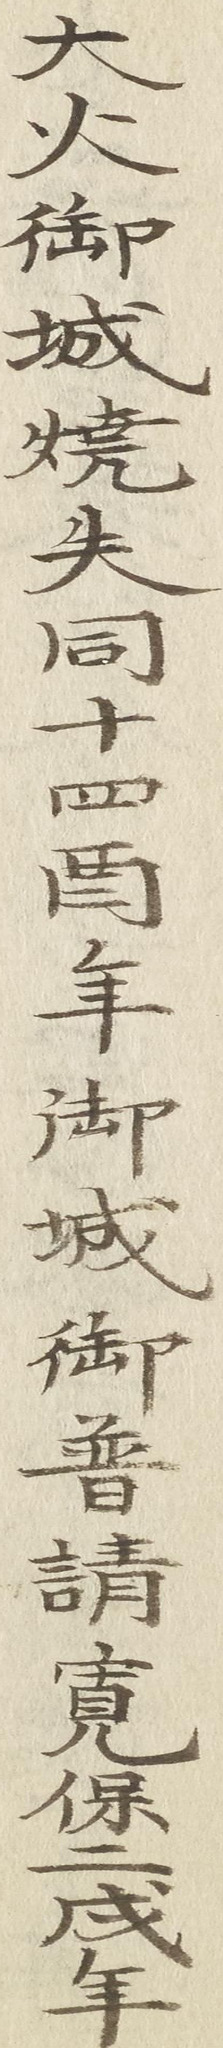大火御城焼失同十四酉年御城御普請寛保二戌年
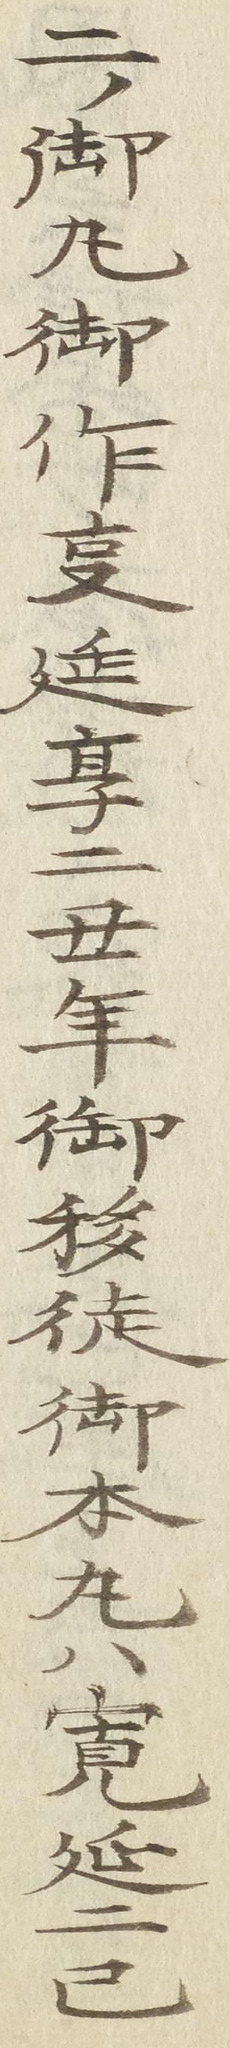二ノ御丸御作事延享二丑年御移徒御本丸ハ寛延二巳
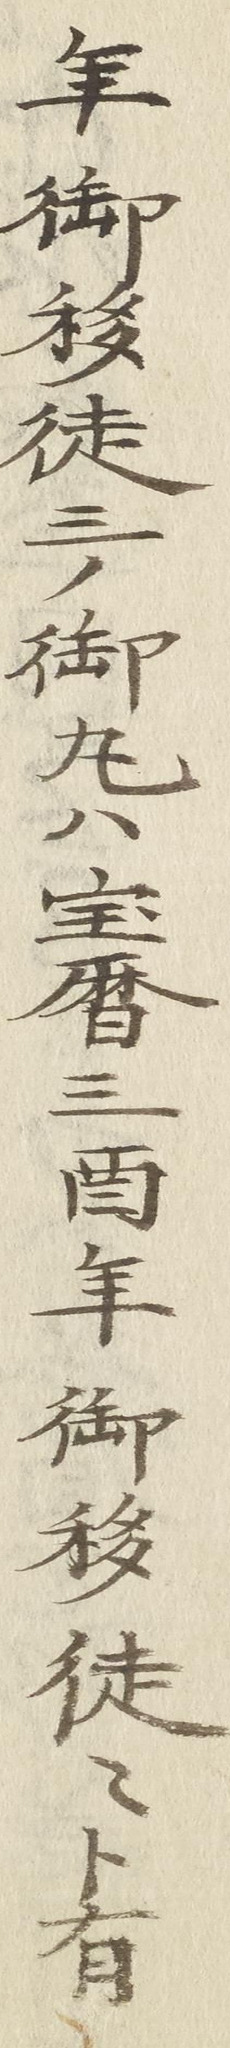年御移徒三ノ御丸ハ宝暦三酉年御移徒々ト有
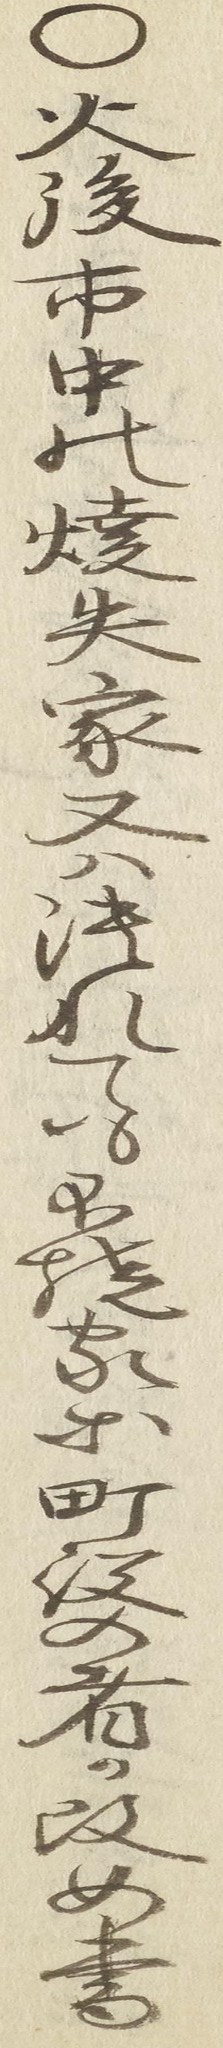○火後市中の焼失家又ハ潰れても不焼家等町役の者か改め書
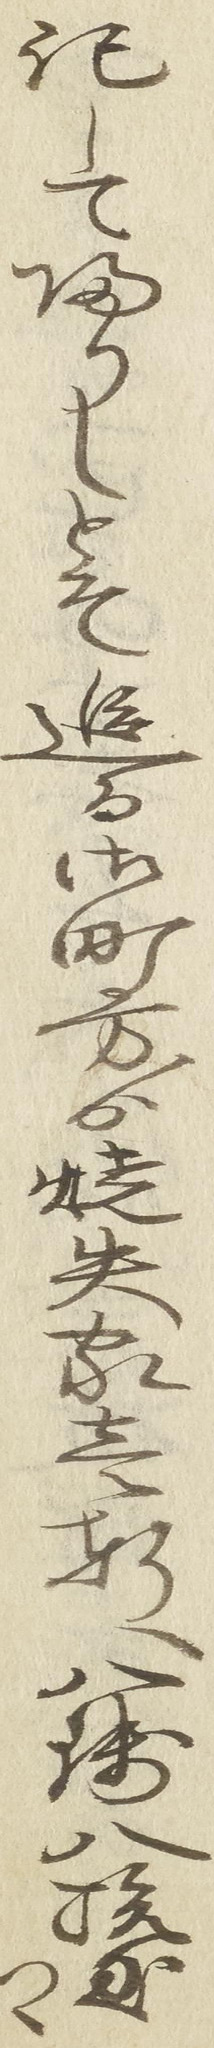記して帰りしとそ追て御町方ゟ焼失家壱軒へ八銭八十匁つゝ
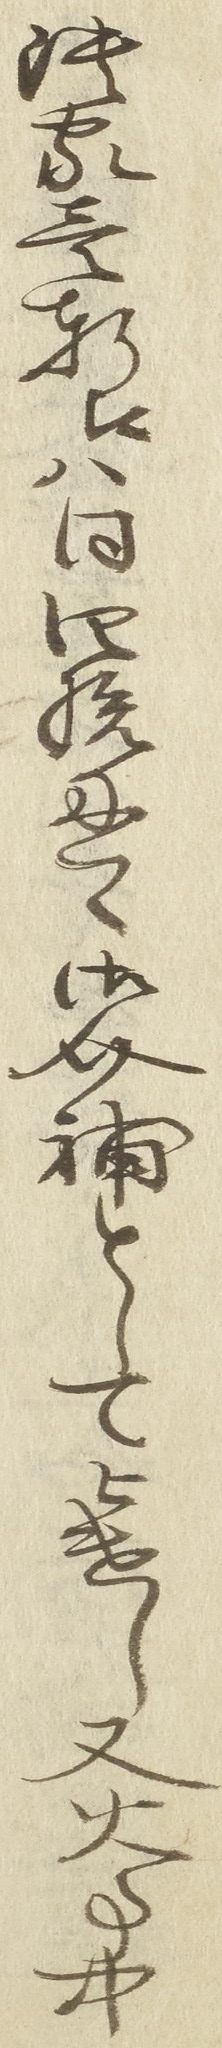潰家一軒江えハ同四拾匁つゝ御介補として被遣し又火事中

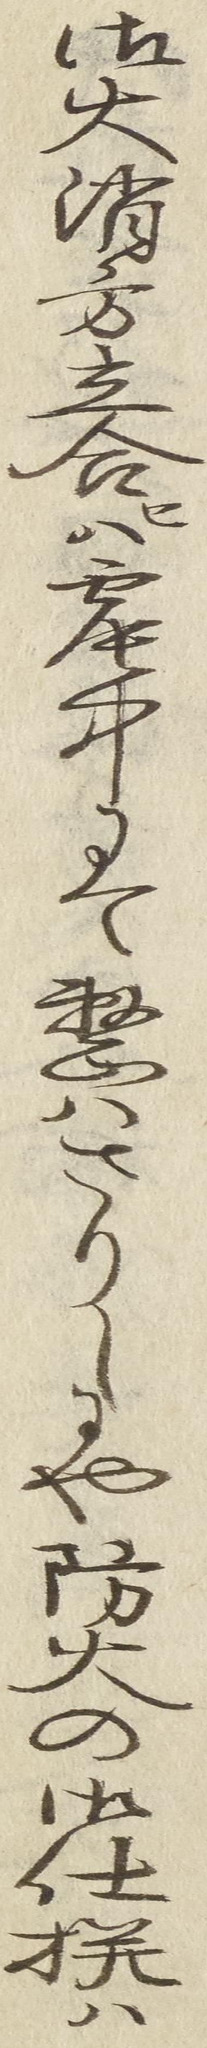御火消方立合ひは震中にて整はさりしにや防火の御仕撰は
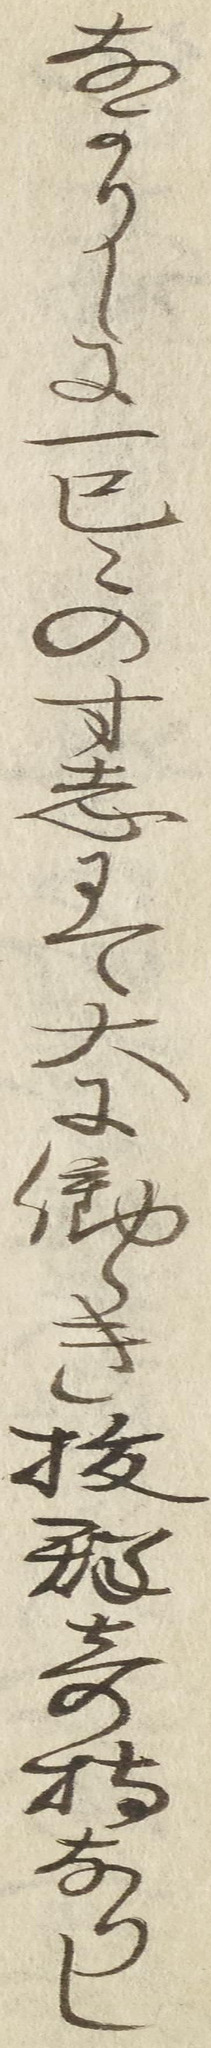なかりしに一己々の寸志にて大に働き抜群奇特なりし
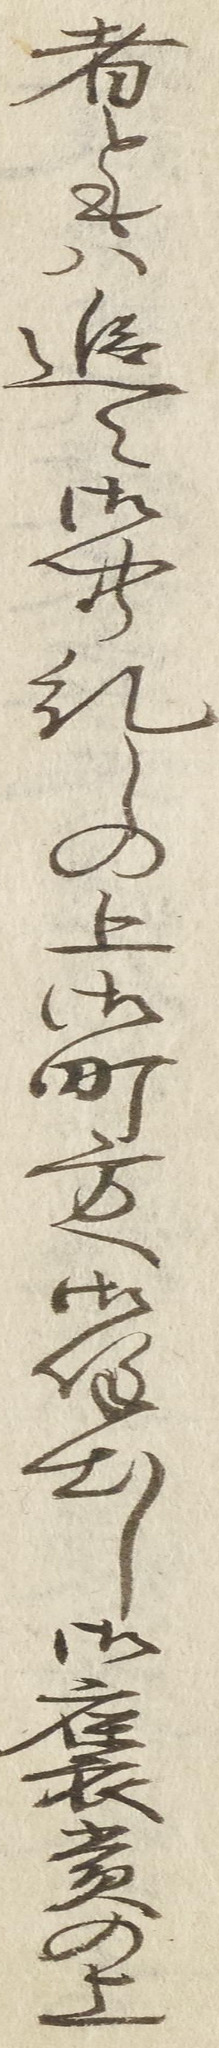者ともは追々御聞糺しの上御町方へ御呼出し御褒賞の上
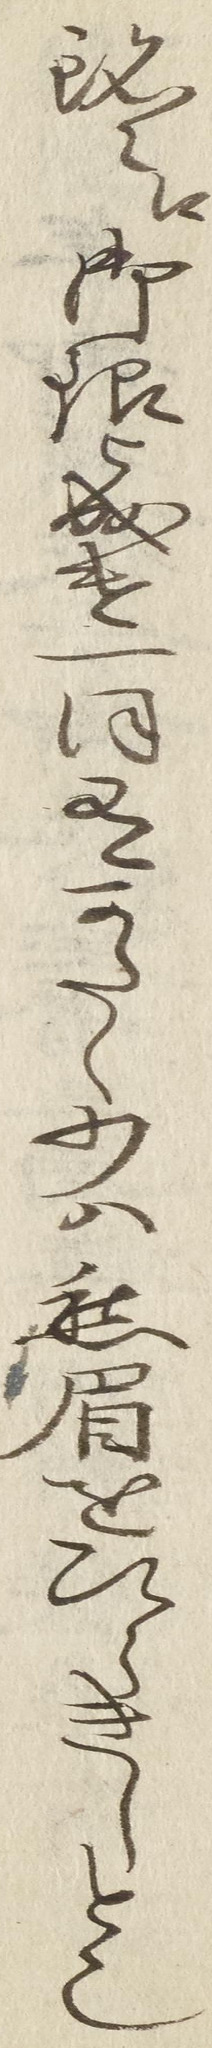銘々に御銀被成遣一同有かたし少は愁眉をひらきしと也
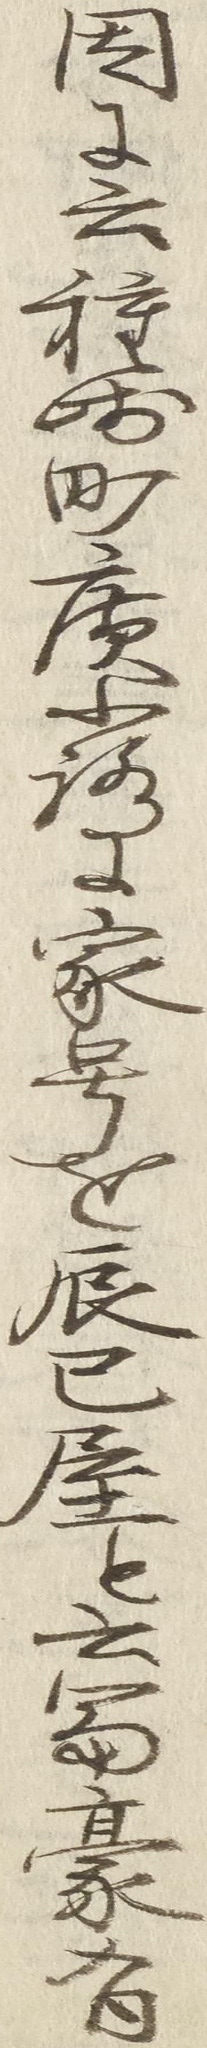因に云種崎町広小路に家号を辰巳屋と云富豪有
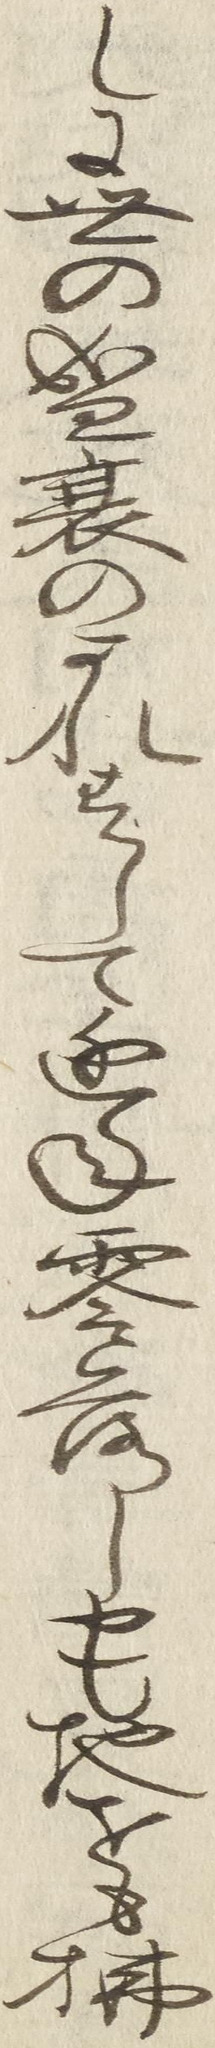しに世の盛衰のかれすして近年零落し宅地をも払
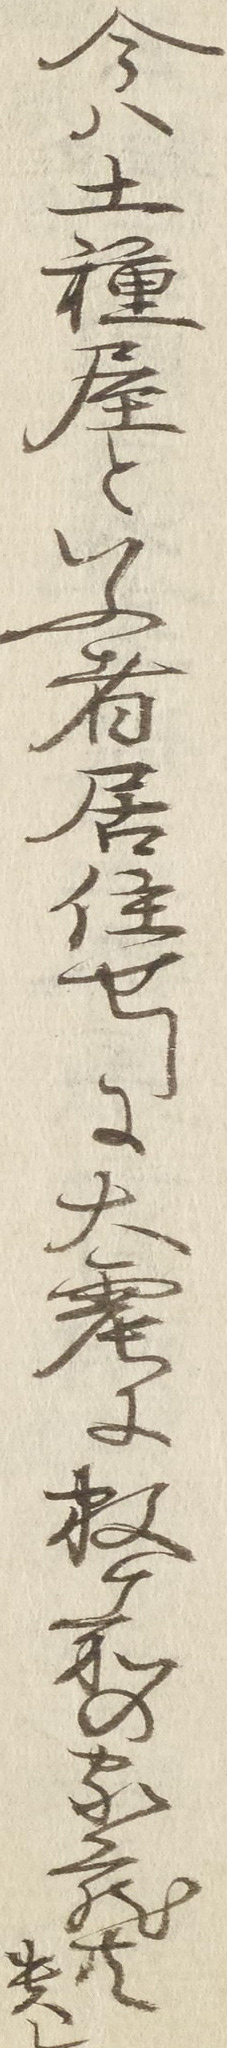今は土種屋といふ者居住せしに大震に数ヶ所の家蔵共潰れ
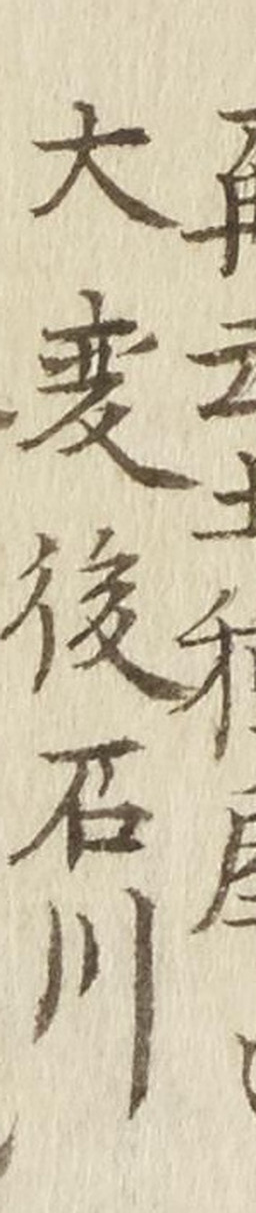大変後石川
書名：地震記　上
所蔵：東京大学地震研究所図書室 Earthquake Research Institute Library, The University of Tokyo, JAPAN
